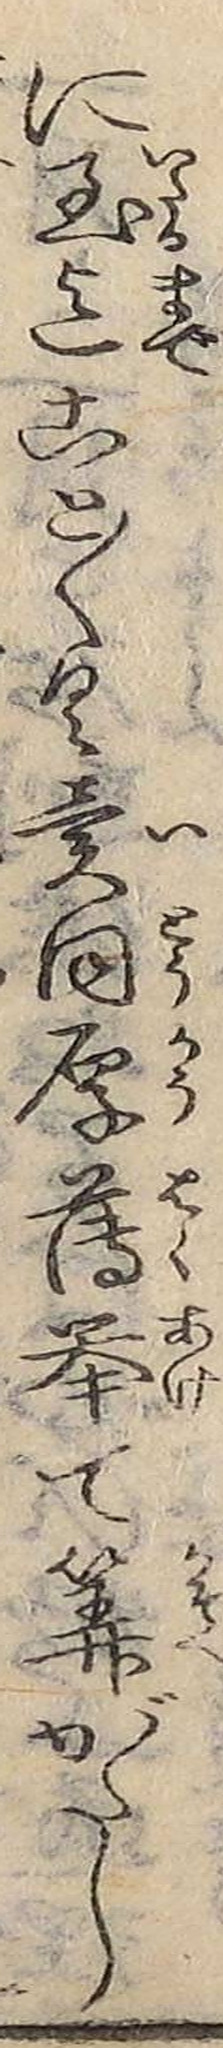に至迄こと〳〵く異同厚薄挙て算がたし
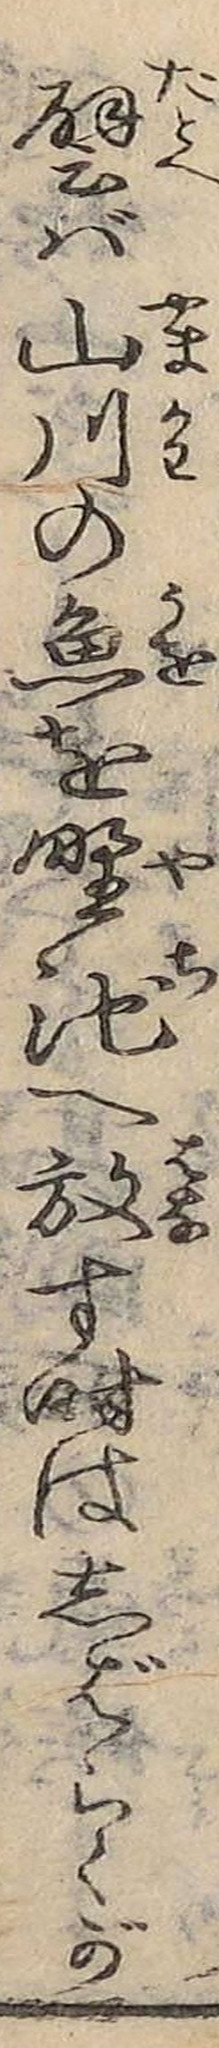譬ば山川の魚を野池へ放す時はしばらくが

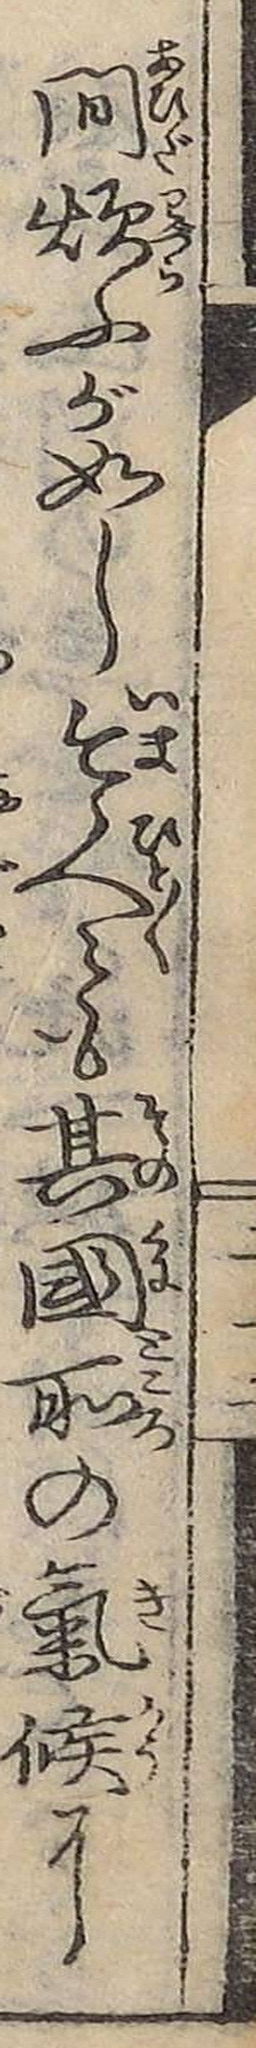間煩ふが如し今人々も其国所の気候に
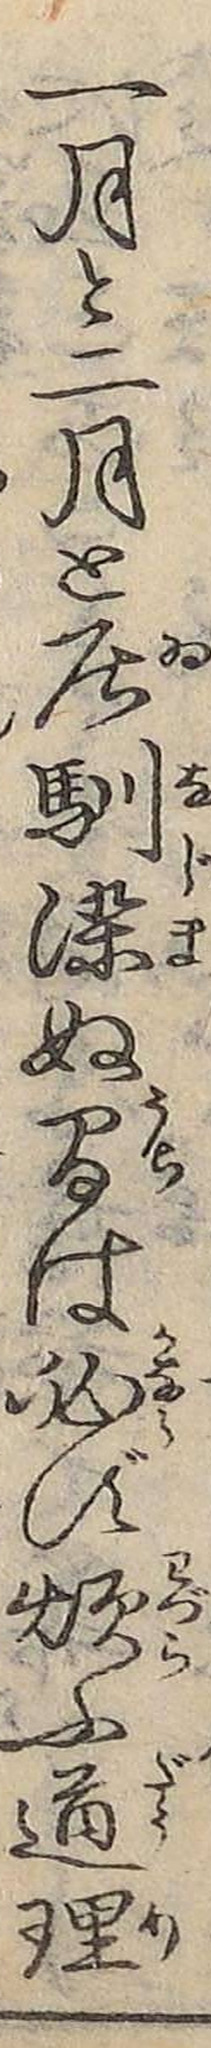一月と二月と居馴染ぬ間は必ず煩ふ道理
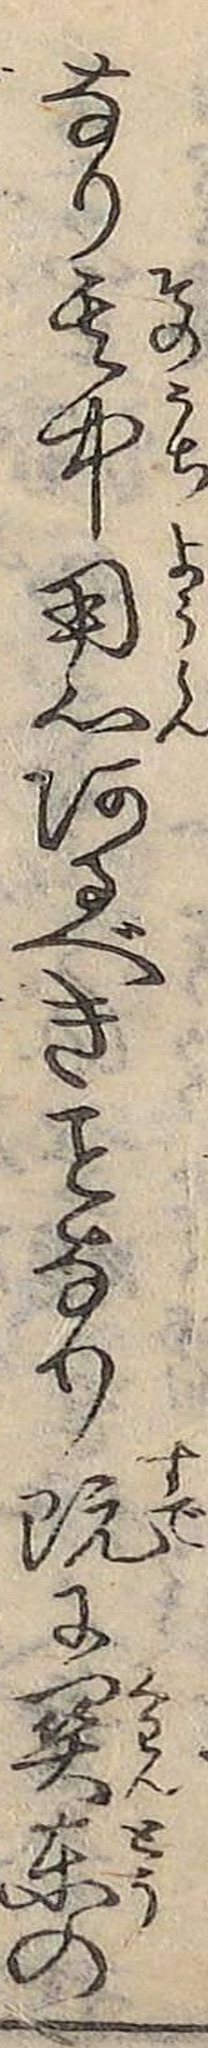なり其中用心あるべきことなり既に関東の
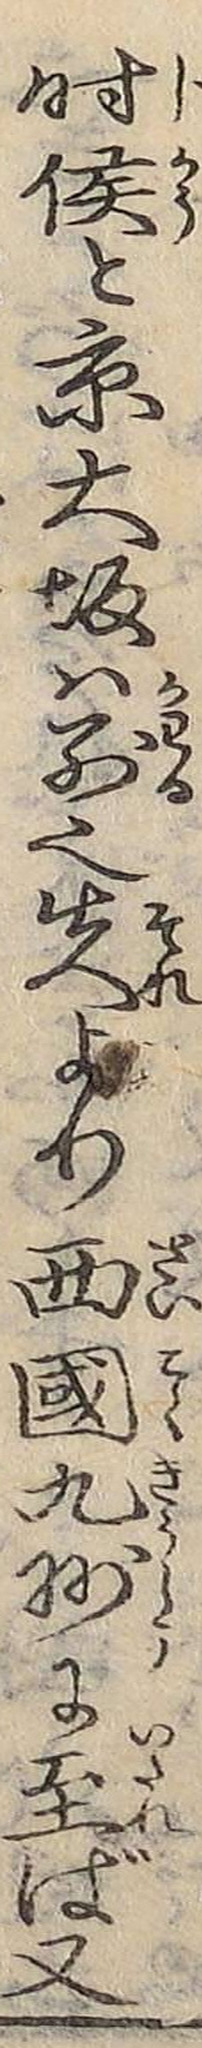時侯と京大坂は別也先より西国九州に至ば又
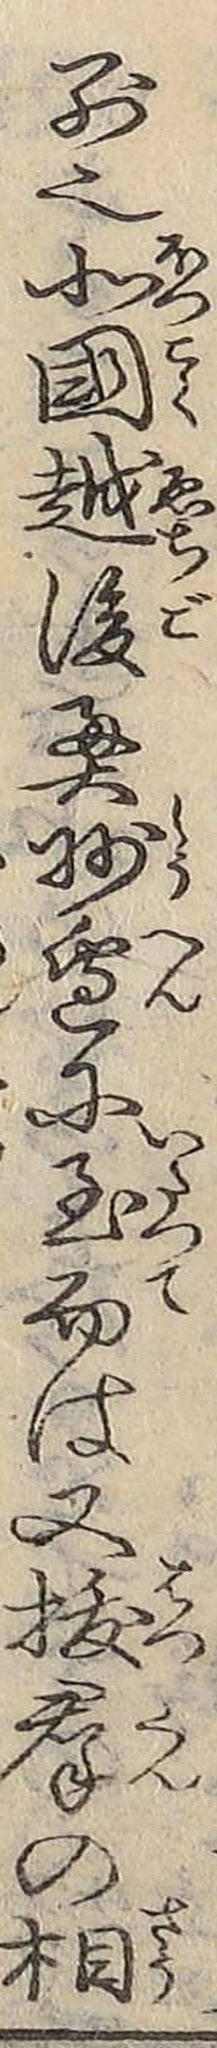別也北国越後奥州辺に至而は又抜群の相
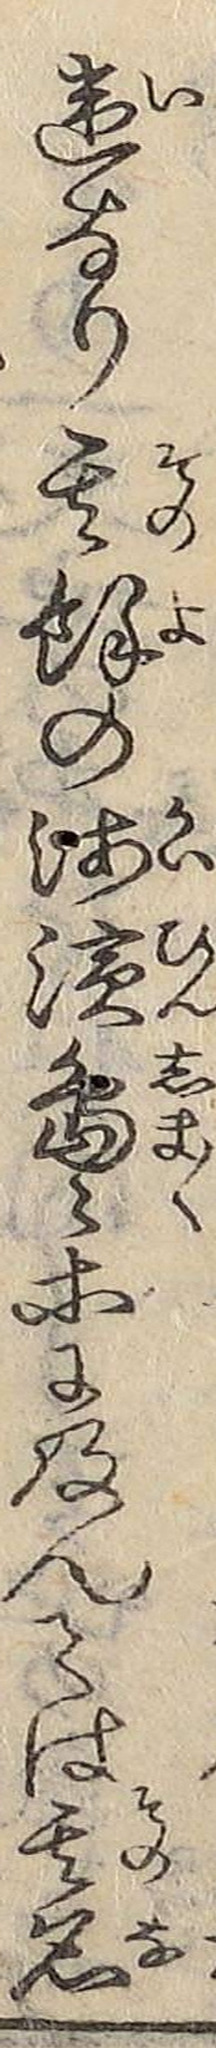違なり其余の海浜島々等に及んては其名
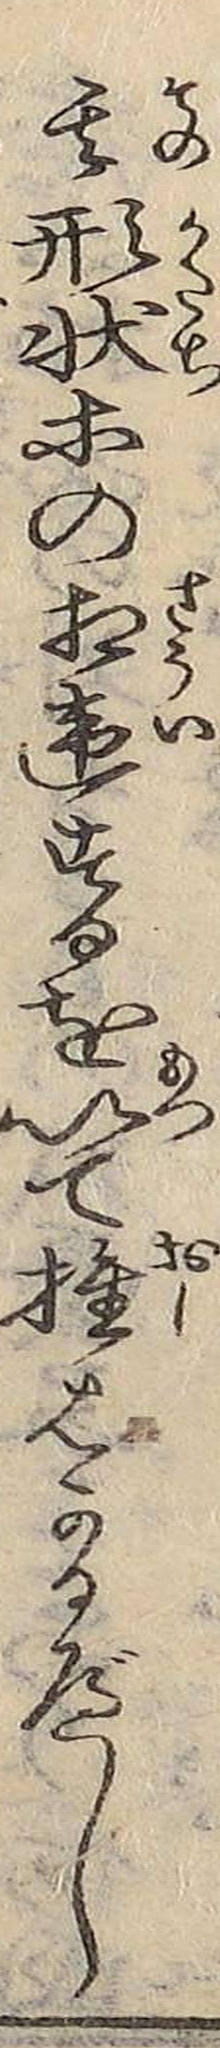其形状等の相違するを以て推はかるべし
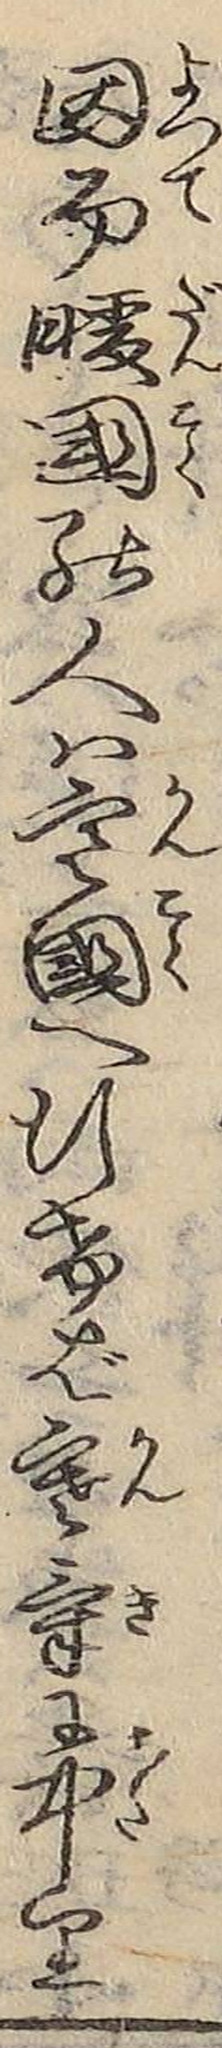因而暖国の人は寒国へ行けば寒気に中り
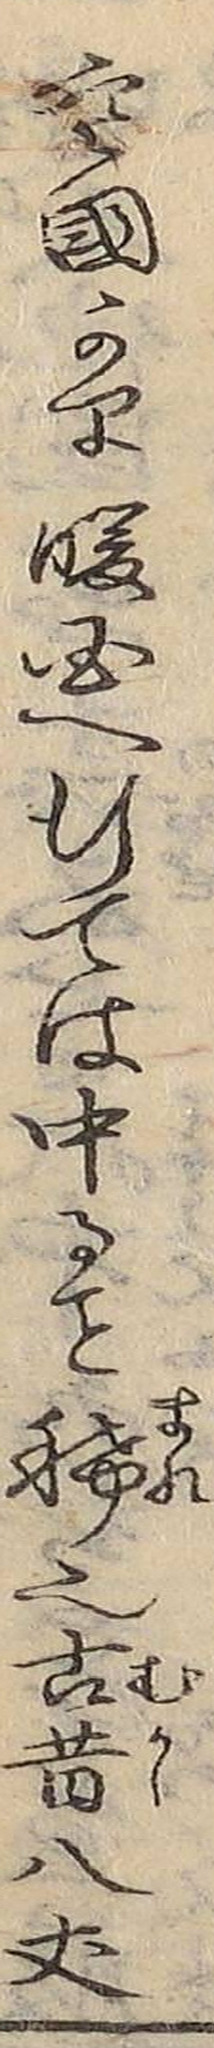寒国より暖国へ行ては中ること稀也古昔八丈
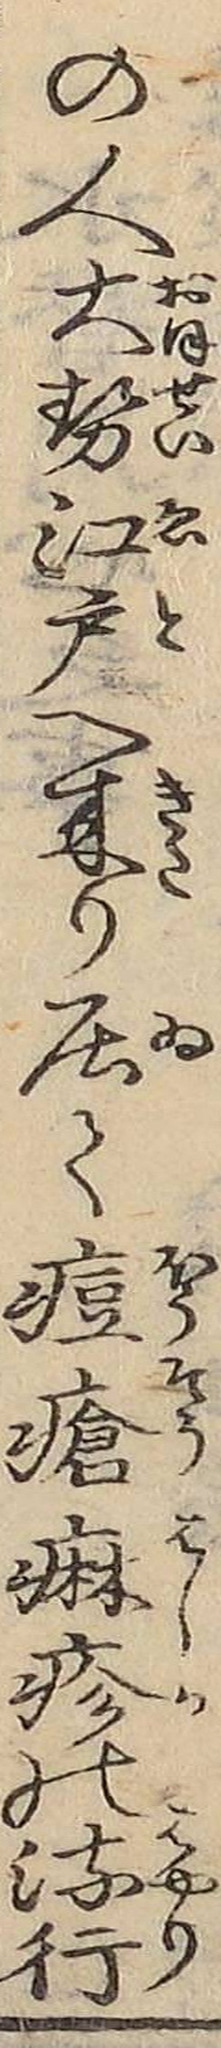の人大勢江戸へ来り居て痘瘡麻疹の流行
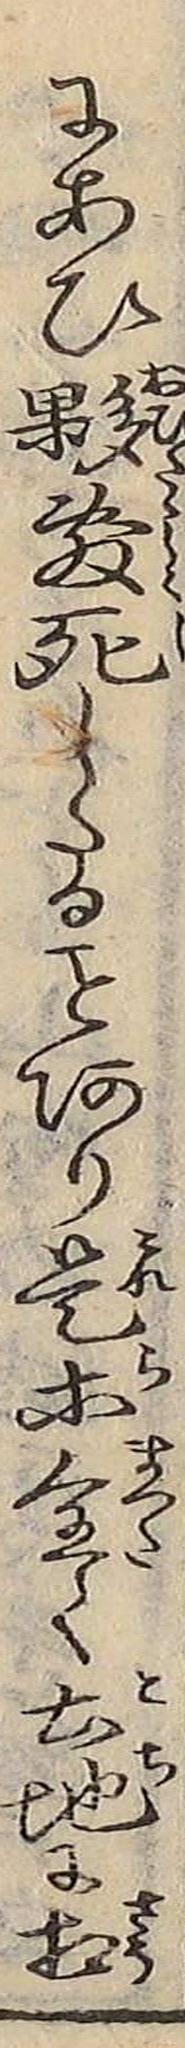にあひ夥敷死したることあり是等全く土地に相
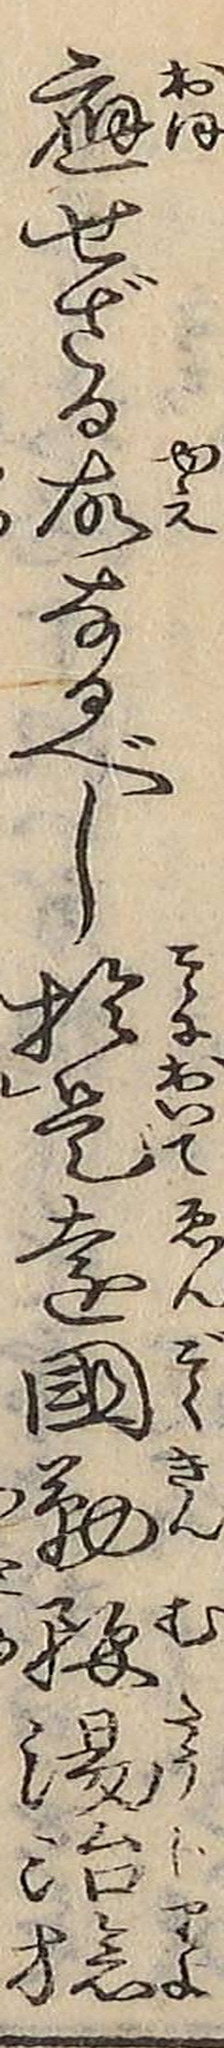応せざる故なるべし於是遠国勤務湯治旅
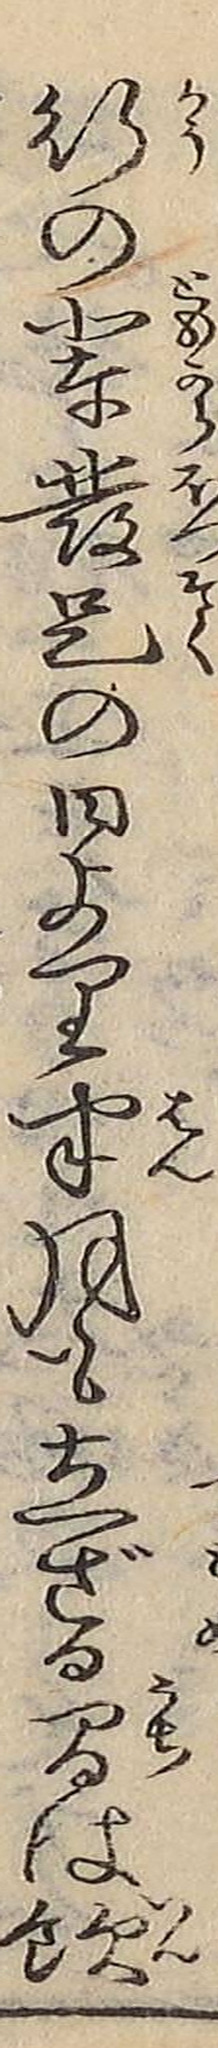行の輩発足の日より半月も立ざる間は飲
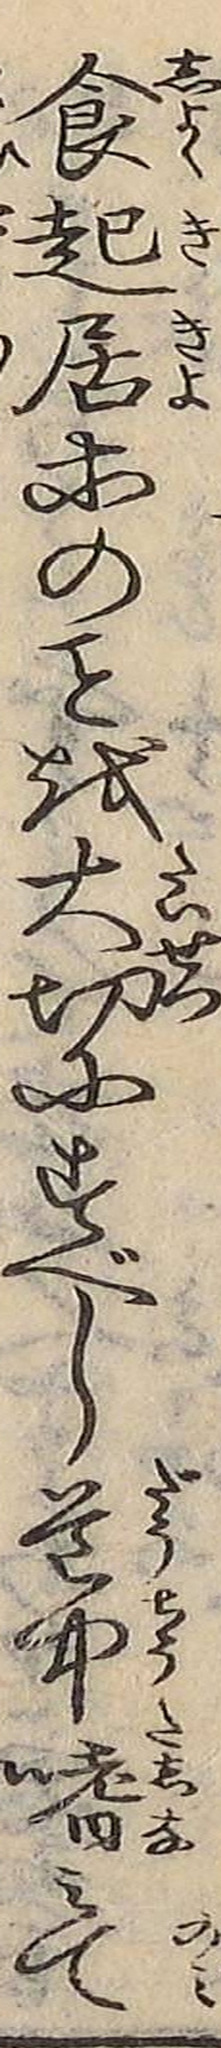食起居等のことを大切にすべし道中嗜みて
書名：旅行用心集
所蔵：神戸大学附属図書館 国文学研究資料館
